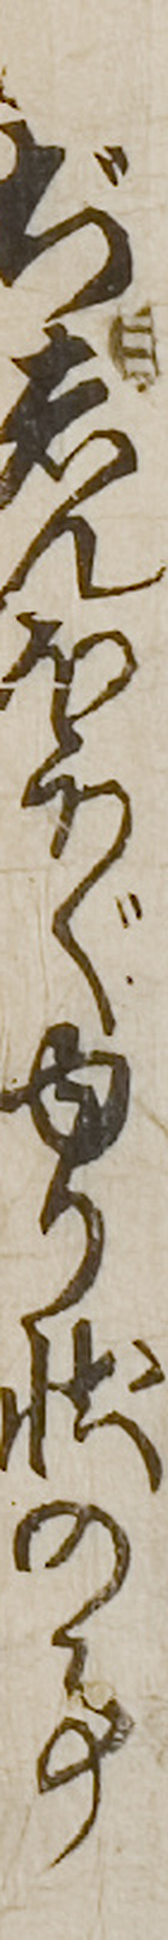ぢしんほう〴〵ゆり状の事
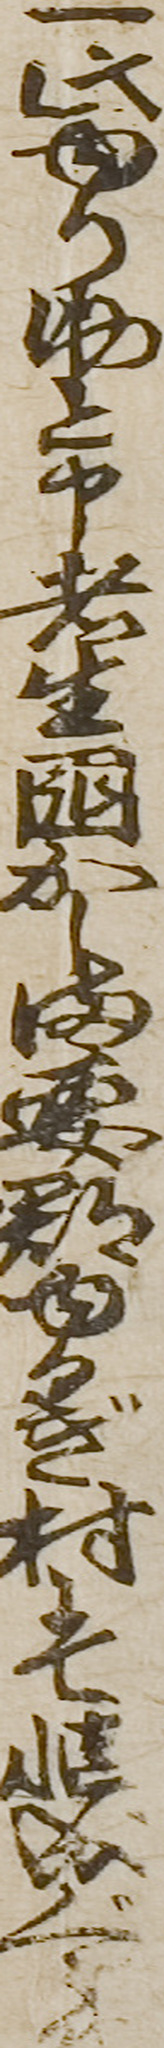一此ゆり助と申者生国かしま要郡ゆるぎ村にて慥成くらす
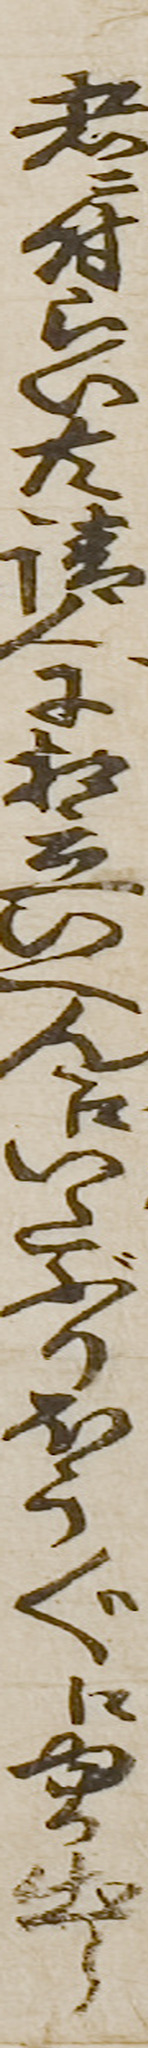者に付らい共請人に相立いへん江いたぶりほう〴〵にゆり出し
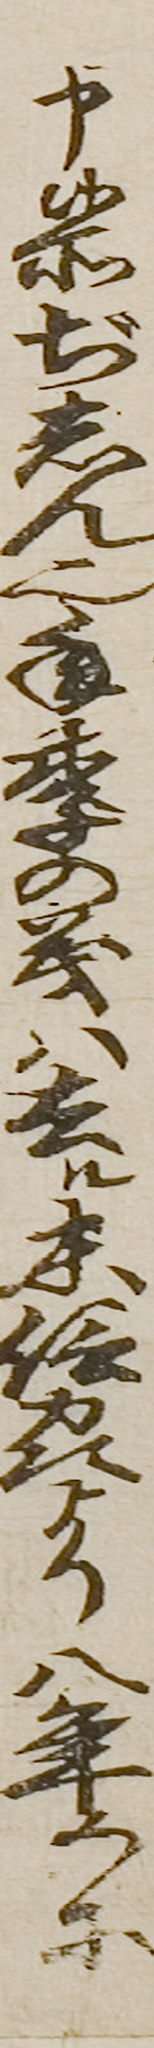申候所ぢしん之年季の義は去ル未信州より八年かに
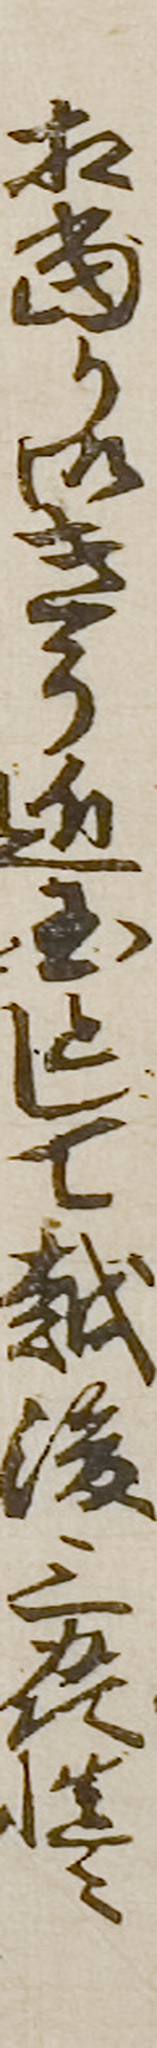相当り御きう近国として越後三州慥に
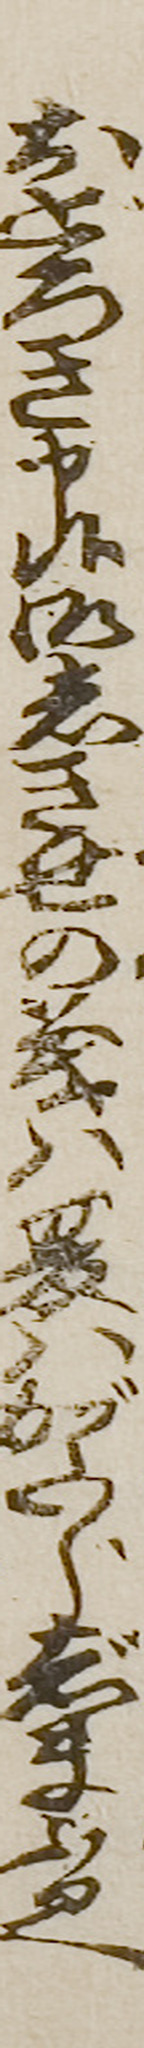おどろき申候御しきせの義は夏はがふらじまふるへ
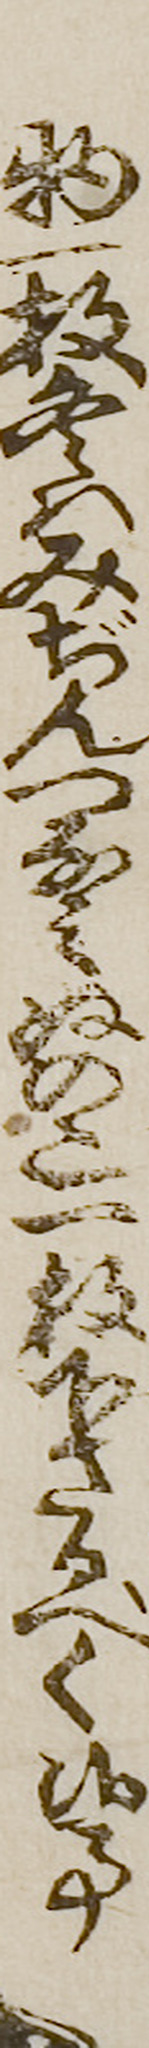物一枚冬はみぢんつなみぬのこ一枚下るべく候事
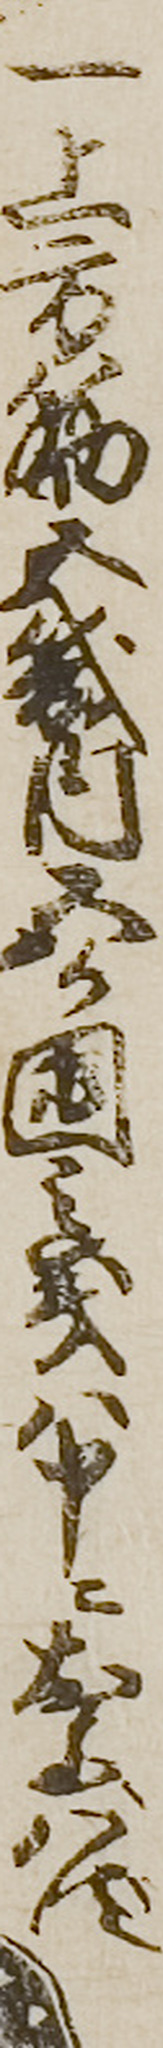一上方筋五畿内五か国之義は申におよはず
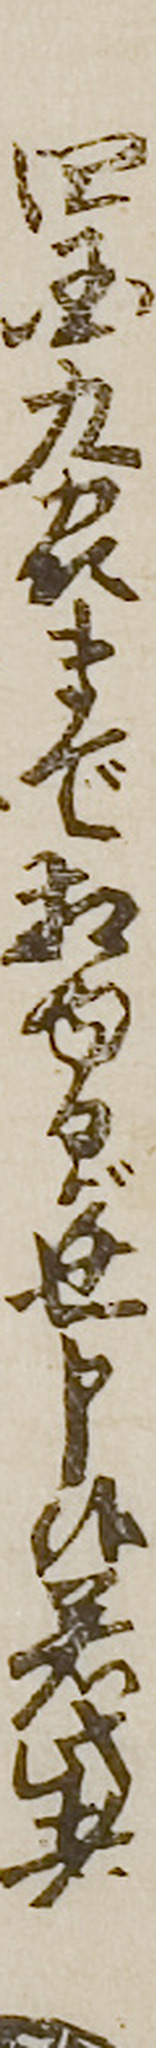四国九州まで相ゆるがせ申候若此者
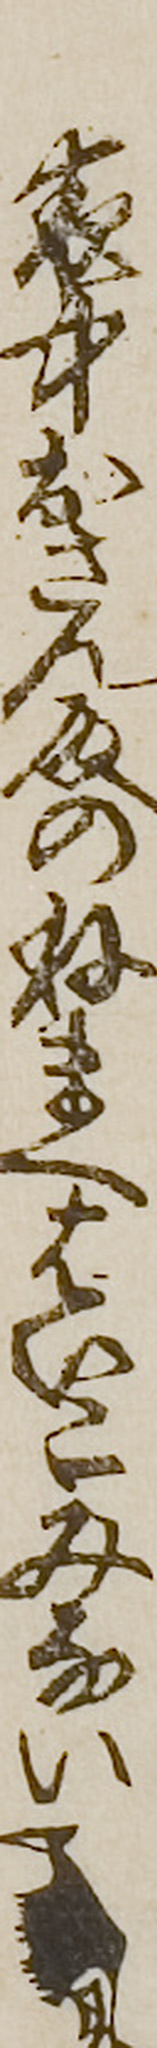夜中おさん殿のねまへはいこみない
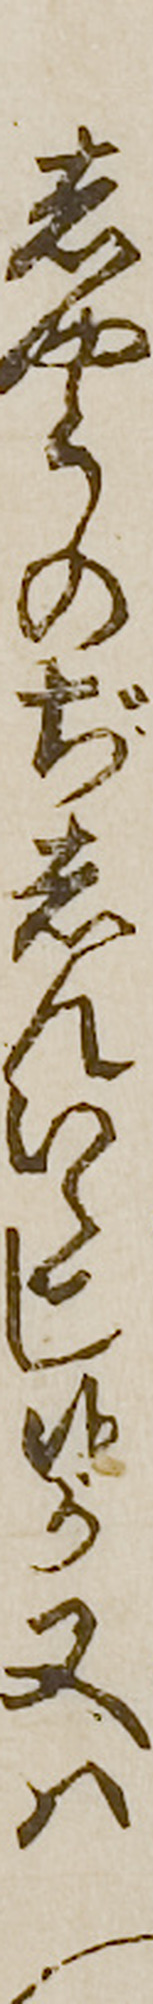しやうのぢしんいたし候か又は
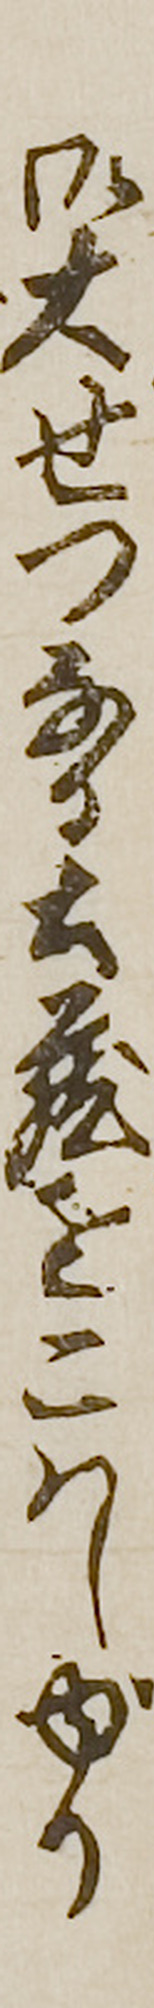御大せつなる大蔵をこはしゆり
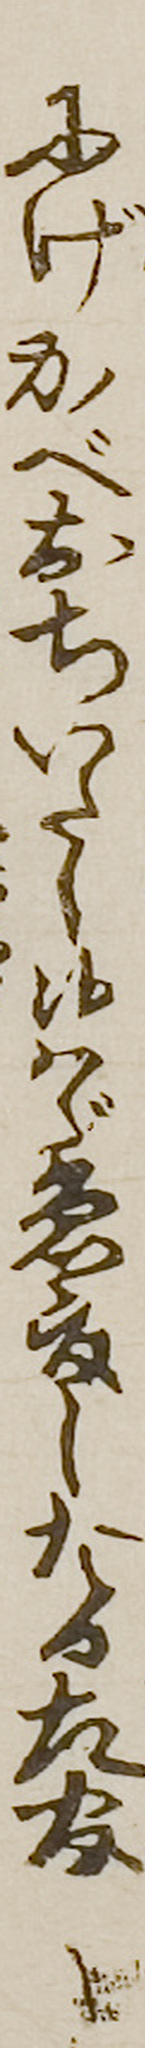にげかべおちいたし候はゞ急度しかる左官
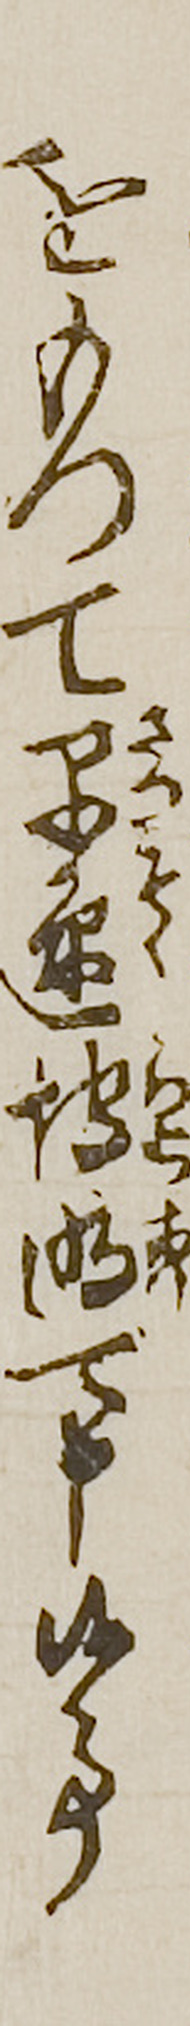をもつて早速埒明可申候事
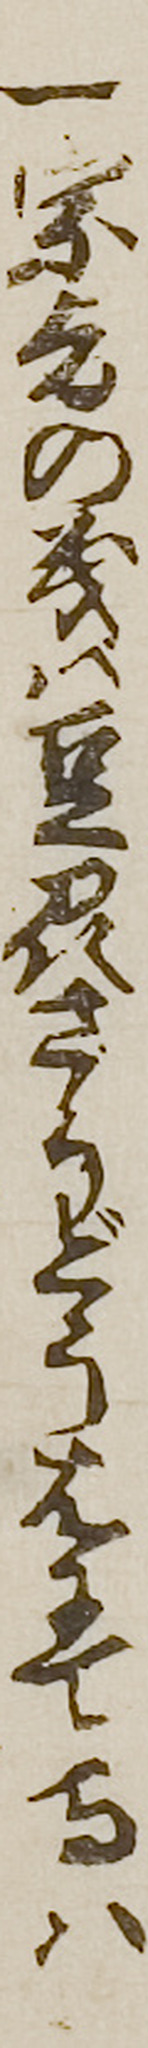一宗旨の義は豆州さうどうはにて寺は
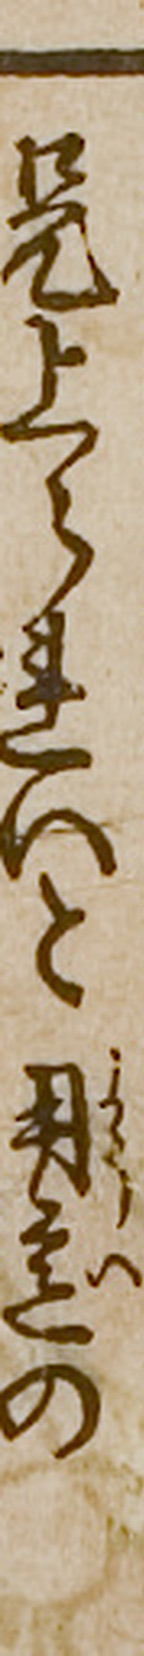是上られいとさし出す
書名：大地震大津浪忠臣蔵九段目秡文句
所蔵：東京大学総合図書館 General Library in the University of Tokyo, JAPAN
